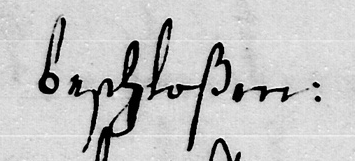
beschloßen:
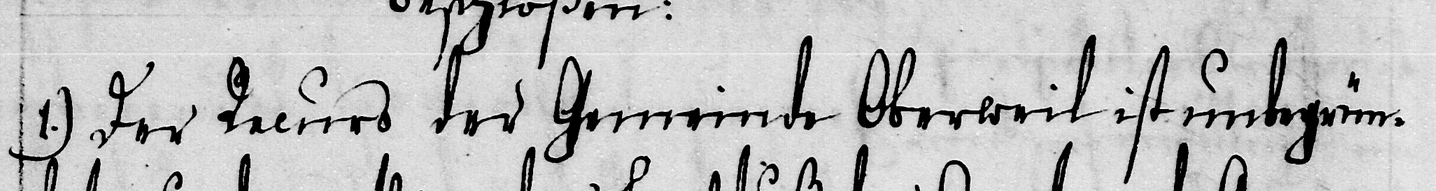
1.) Der Recurs der Gemeinde Oberweil ist unbegrün¬
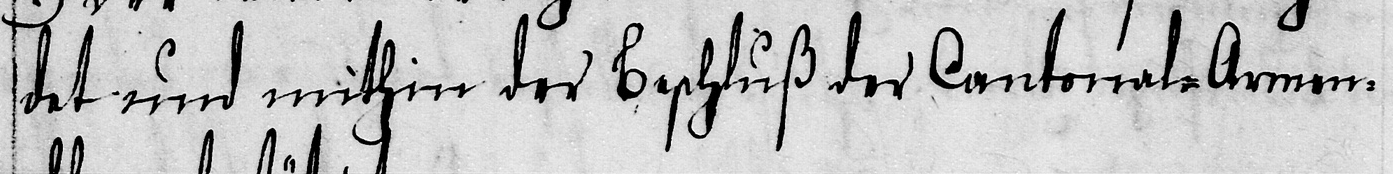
det und mithin der Beschluß der Cantonal-Armen¬
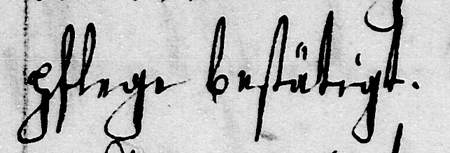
pflege bestätigt.
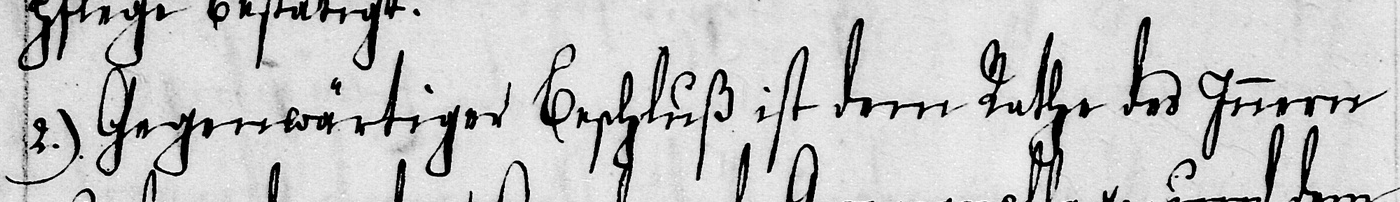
2.) Gegenwärtiger Beschluß ist dem Rathe des Innern
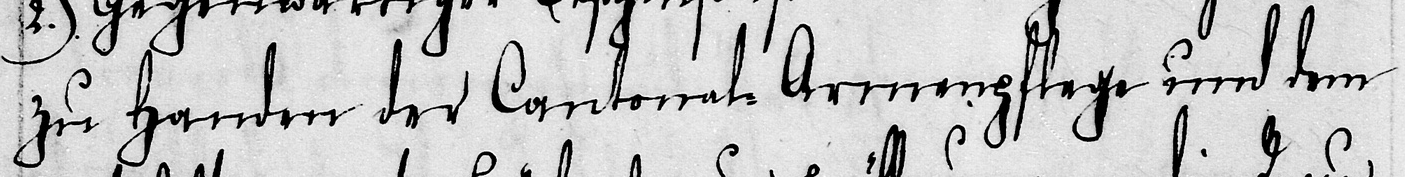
zu Handen der Cantonal-Armenpflege und dem
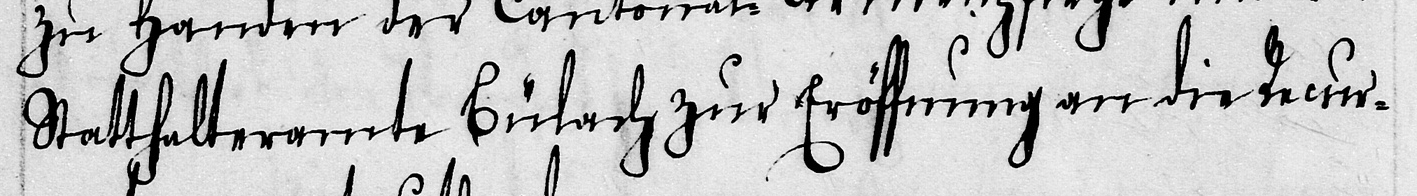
Statthalteramte Bülach zur Eröffnung an die Recur¬
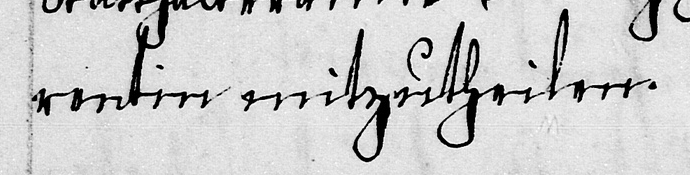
rentin mitzutheilen.
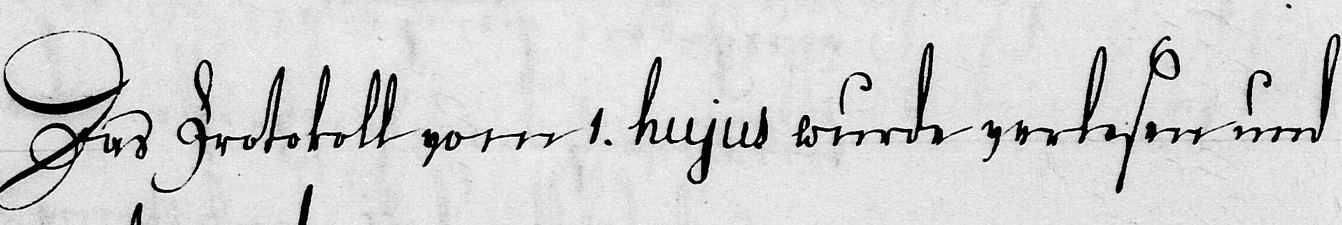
Das Protokoll vom 1. hujus wurde verlesen und
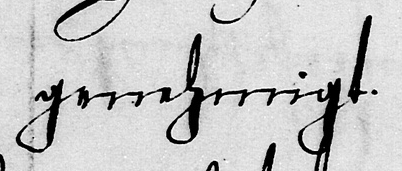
genehmigt.
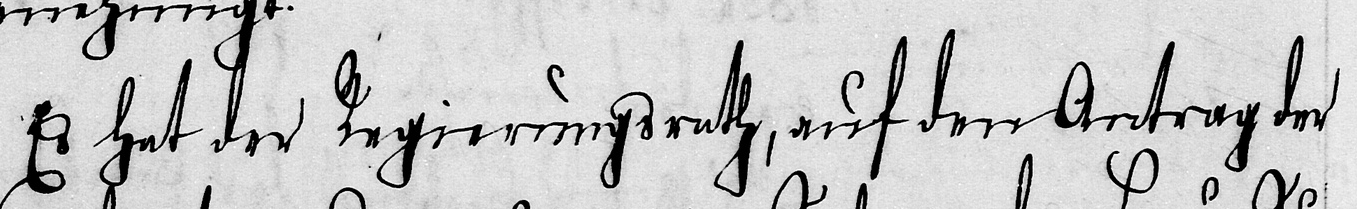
Es hat der Regierungsrath, auf den Antrag der
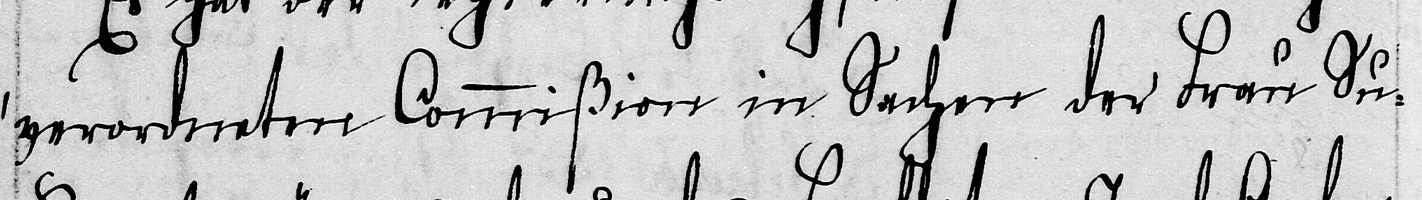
verordneten Commißion in Sachen der Frau Sus¬
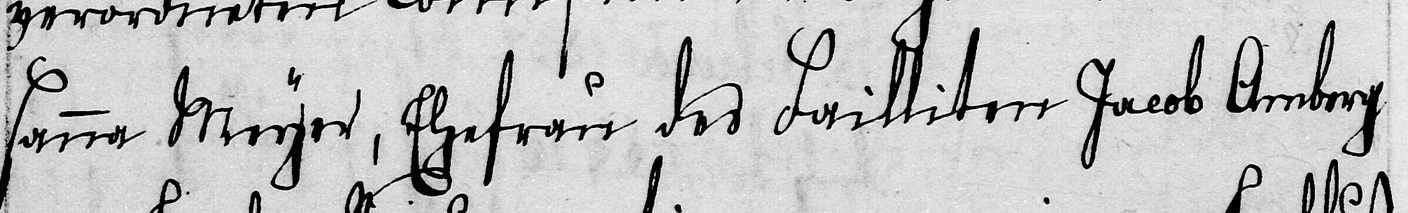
anna Meyer, Ehefrau des Failliten Jacob Arnberg
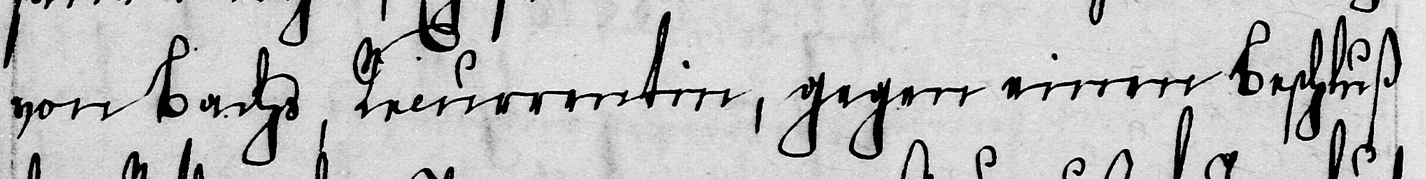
von Bachs, Recurrentin, gegen einen Beschluß
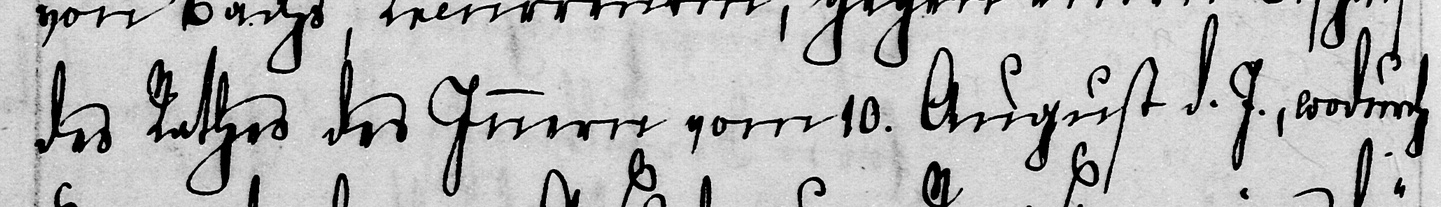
des Rathes des Innern vom 10. August d. J., wodur¬
